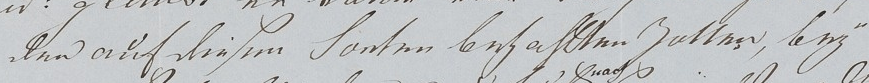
den auf diesen Sorten bezahlten Zollen, bey
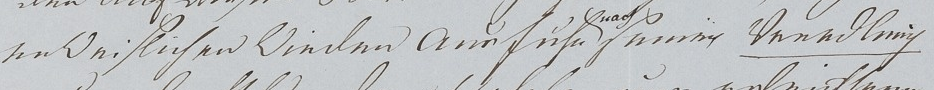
erweislicher Wieder Ausfuhr nach seiner Veredlung
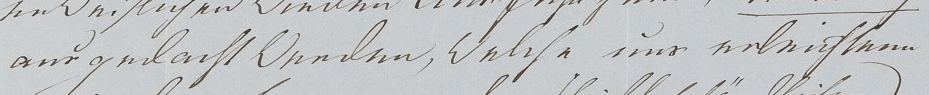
ausgedacht werden, welche uns erleichtern
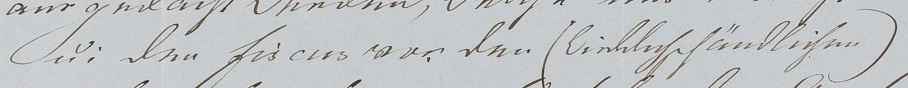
u: den Fiscus vor den (wirklich schändlichen)
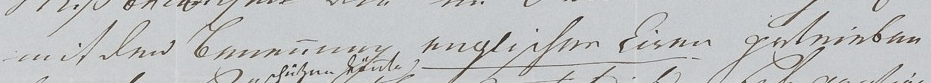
mit der Benennung engliches Eisen getrieben
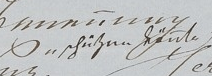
seye u schützen könnte.
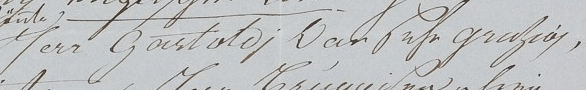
Herr Gastoldi war sehr grazios,
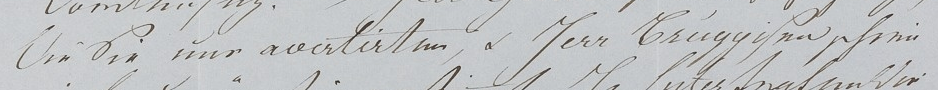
wie Sie uns avertirten, & Herr Bruggisser schien
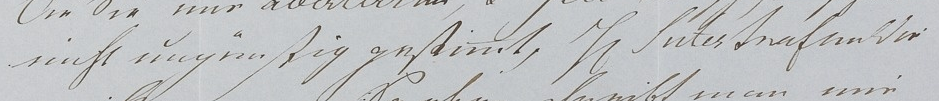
nicht ungünstig gestimmt, Herrn Suter trafen wir
